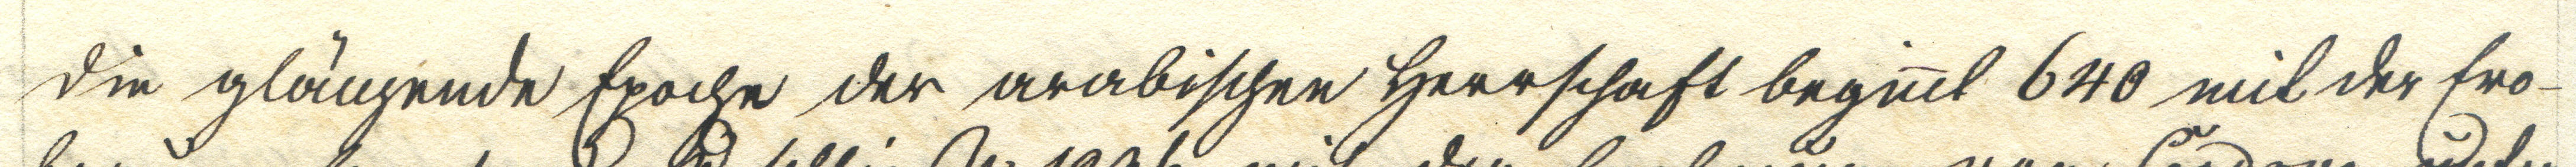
Die glänzende Epoche der arabischen Herschaft begiñt 640 mit der Ero-
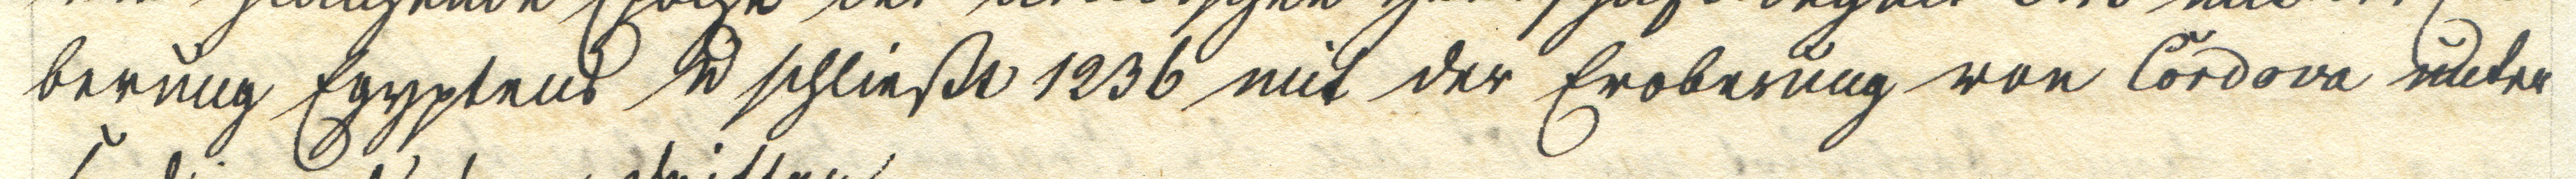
berung Egyptens u schließt 1236 mit der Eroberung von Cordova unter
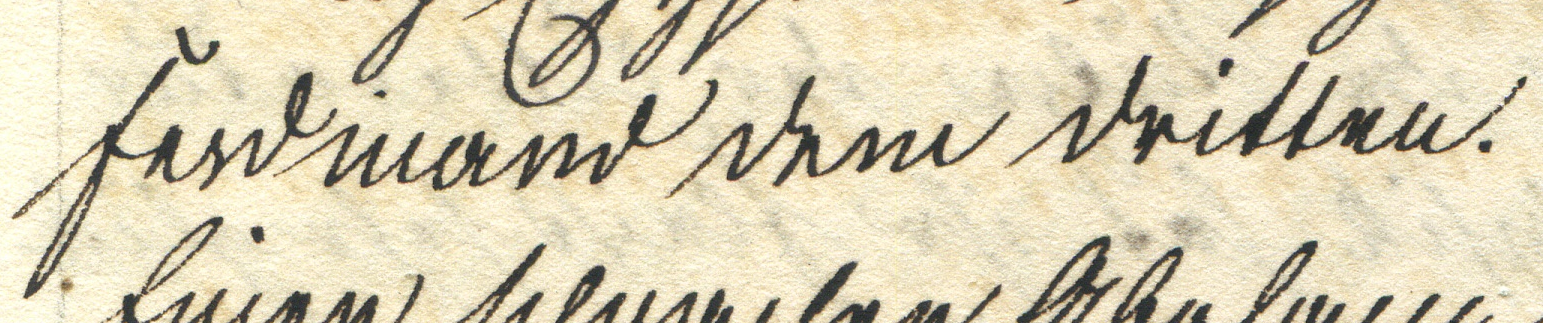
Ferdinand dem Dritten.
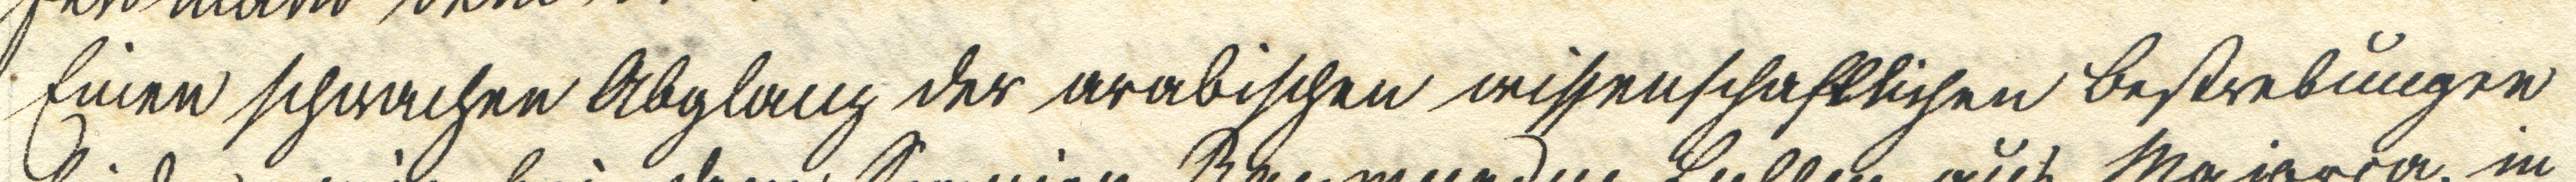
Einen schwachen Abglanz der arabischen wissenschaftlichen Bestrebungen
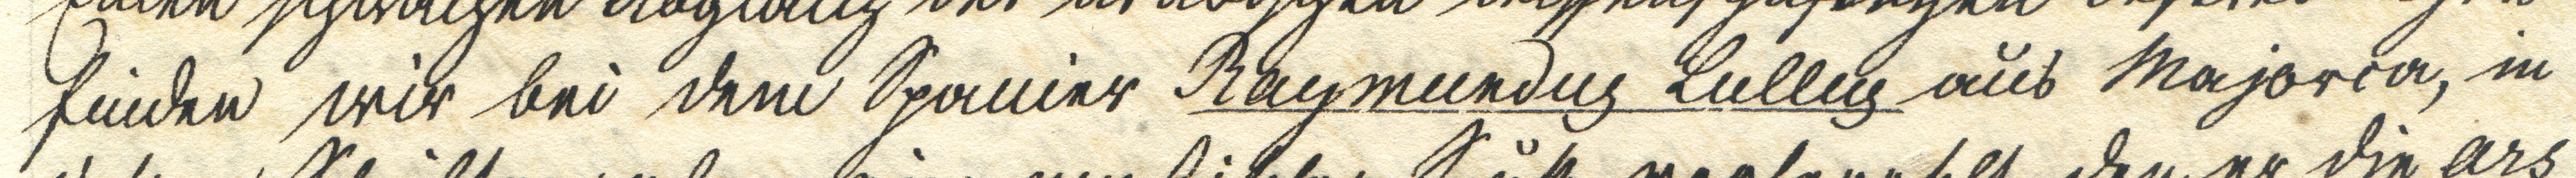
finden wir bei dem Spanier Raymundus Lullus aus Majorca, in
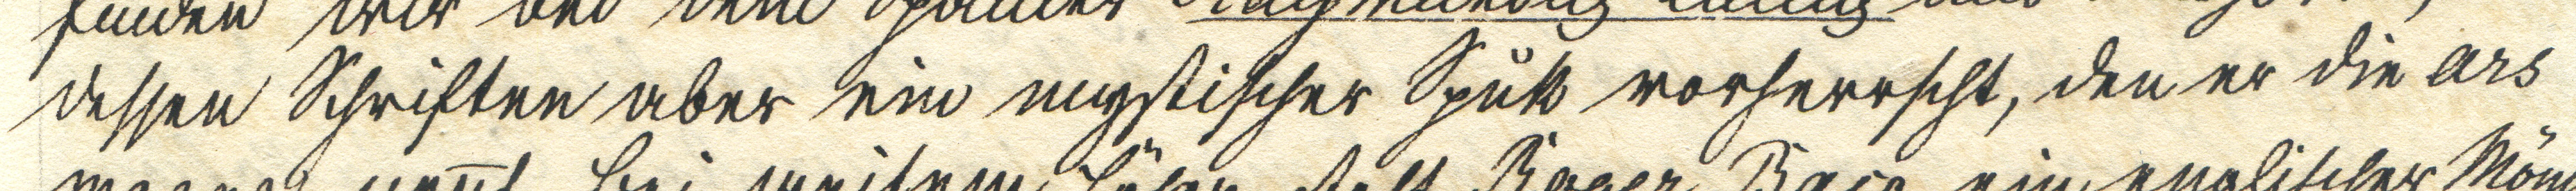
dessen Schriften aber ein mystischer Spuk vorherrscht, den er die ars
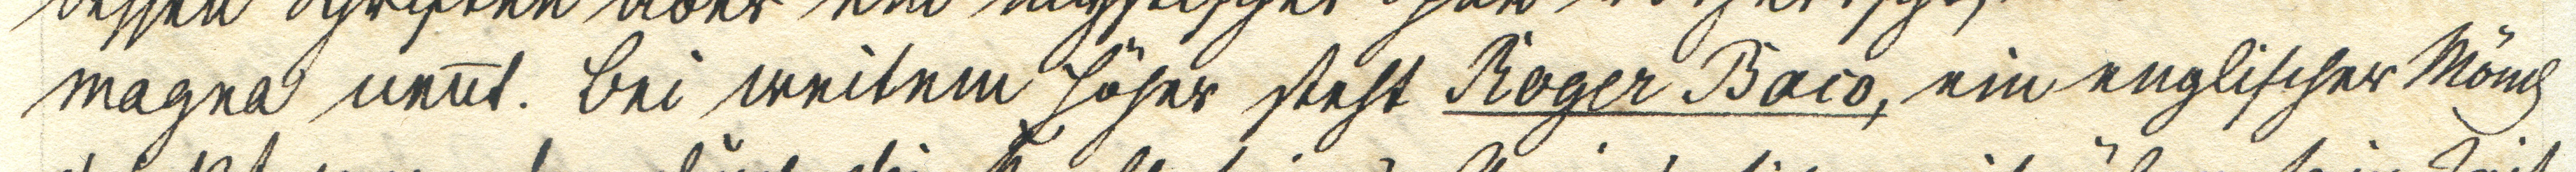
magna neñt. Bei weitem höher steht Roger Baco, ein englischer Mönch
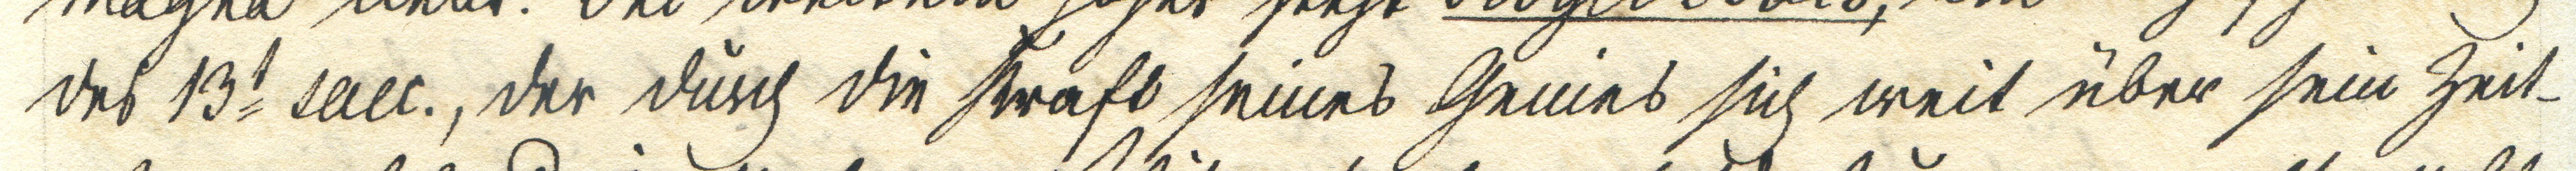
des 13t saec., der durch die Kraft seines Genies sich weit über sein Zeit-
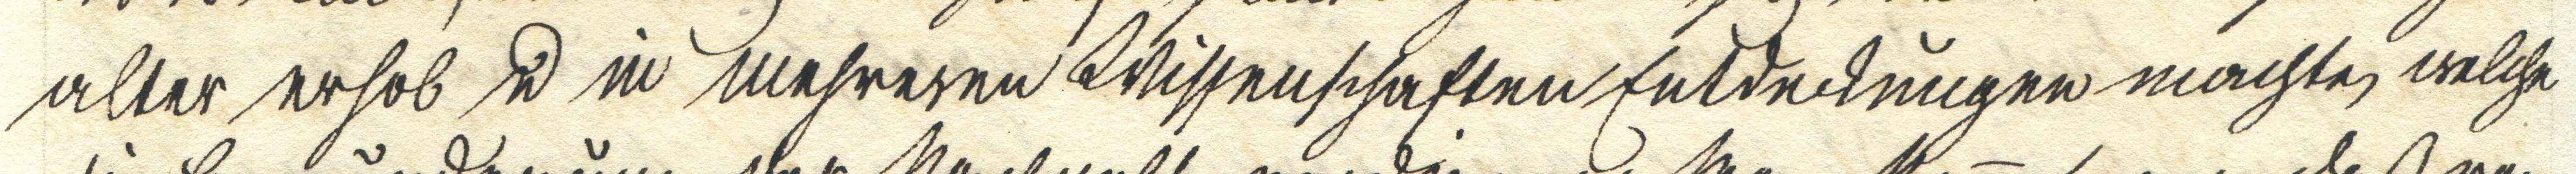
alter erhob u in mehreren Wissenschaften Entdeckungen machte, welche
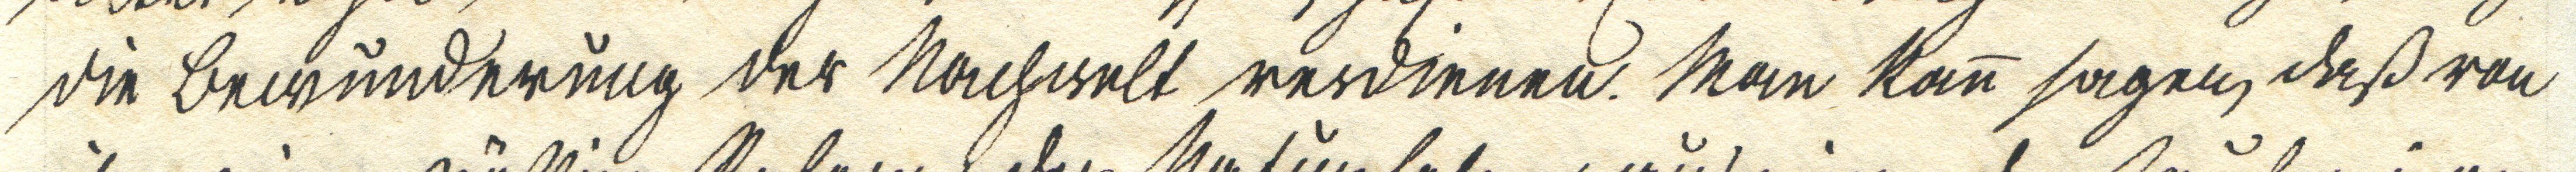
die Bewunderung der Nachwelt verdienen. Man kañ sagen, daß von
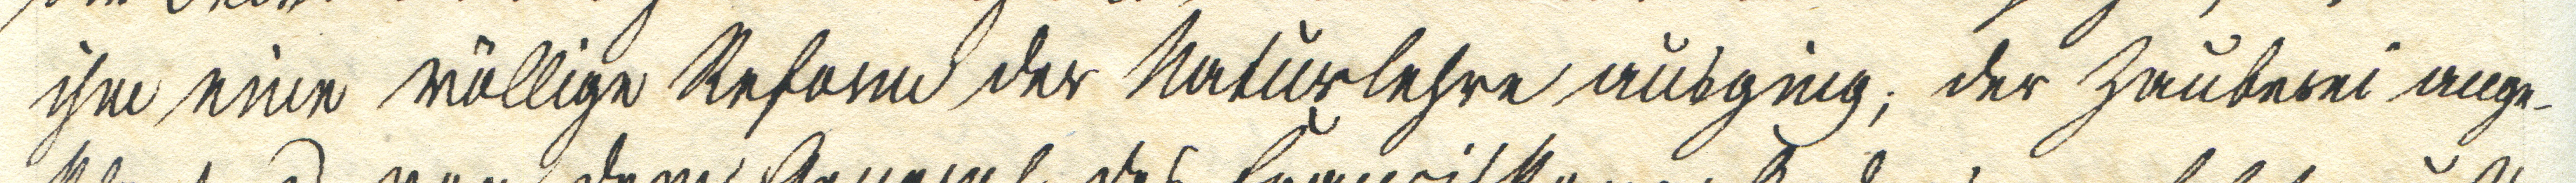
ihm eine völlige Reform der Naturlehre ausging. Der Zauberei ange-
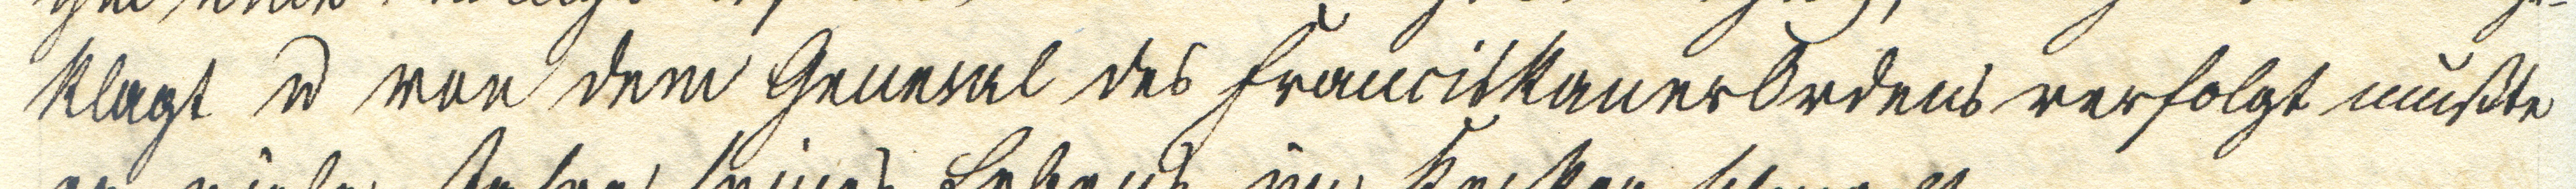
klagt u von dem General des FranciskanerOrdens verfolgt mußte
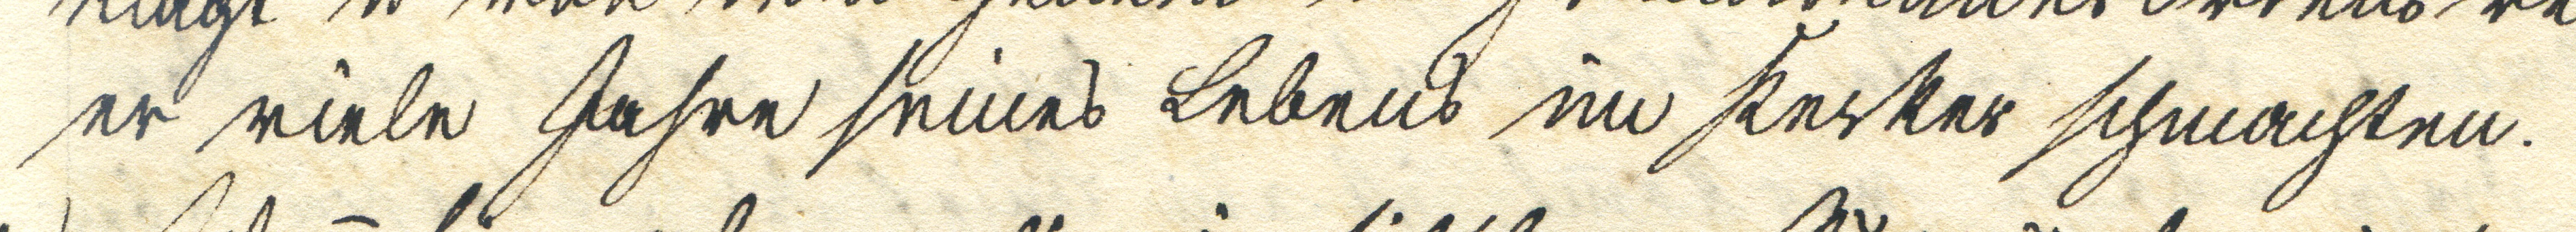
er viele Jahre seines Lebens im Kerker schmachten.
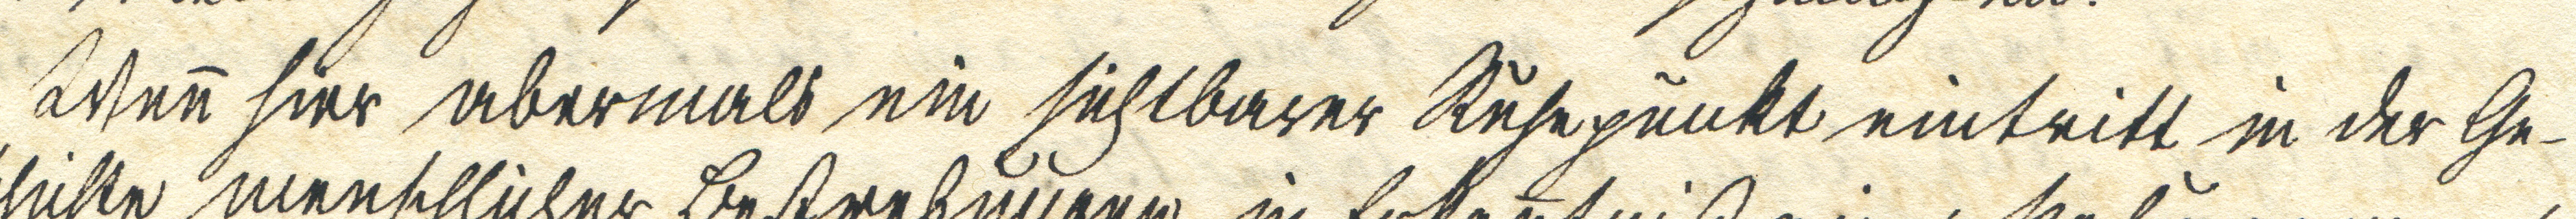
Weñ hier abermals ein sichtbarer Ruhepunkt eintritt in der Ge-
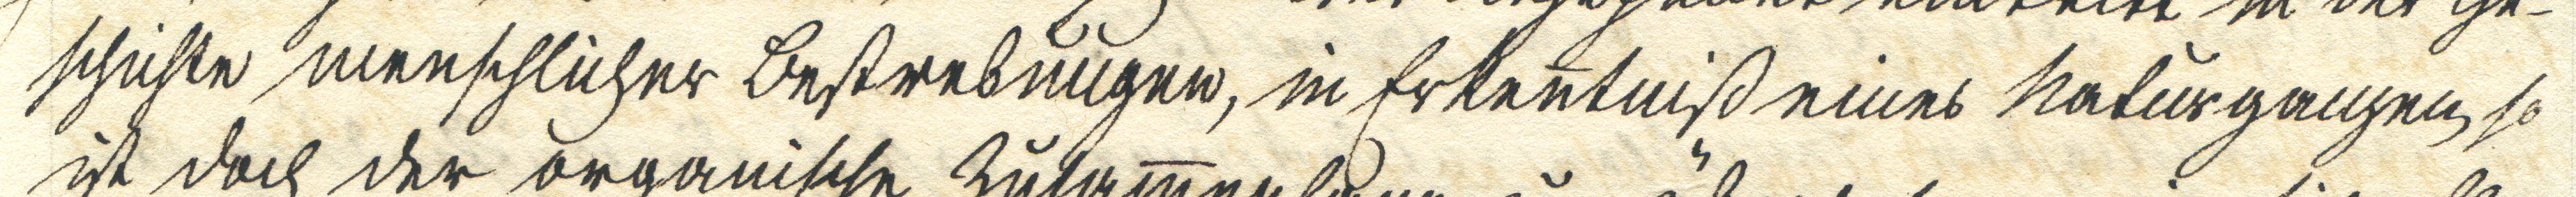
schichte menschlicher Bestrebungen, in Erkeñtniß eines Naturganzen, so
